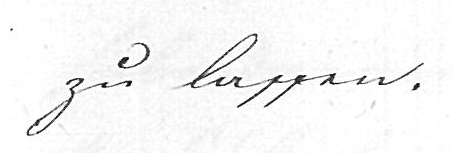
zu lassen.
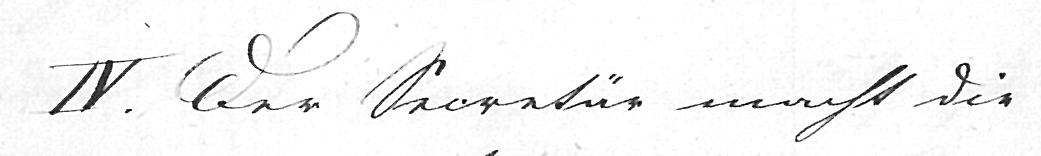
IV. Der Secretär macht die
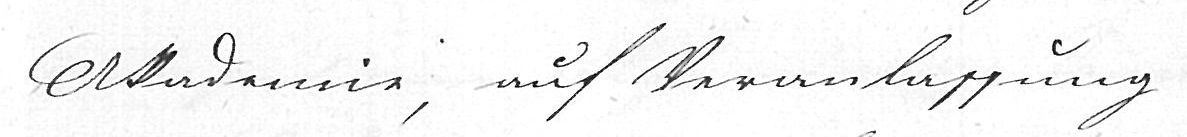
Akademie, auf Veranlassung
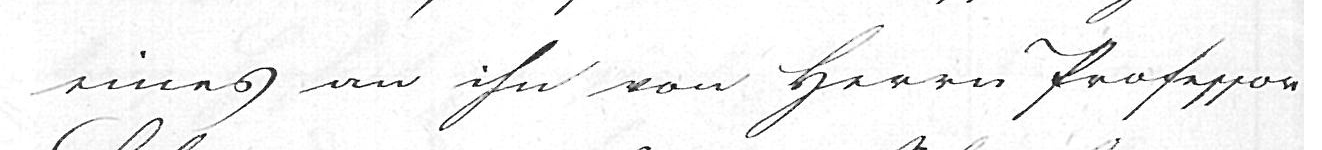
eines an ihn von Herrn Professor
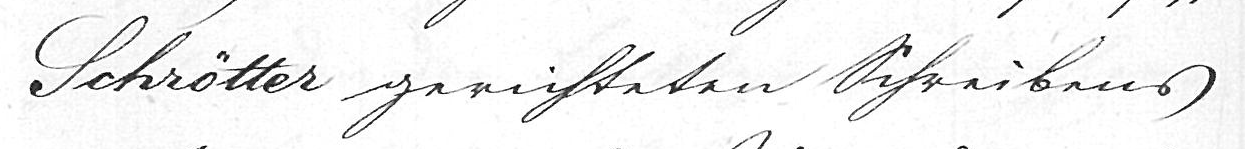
Schrötter gerichteten Schreibens
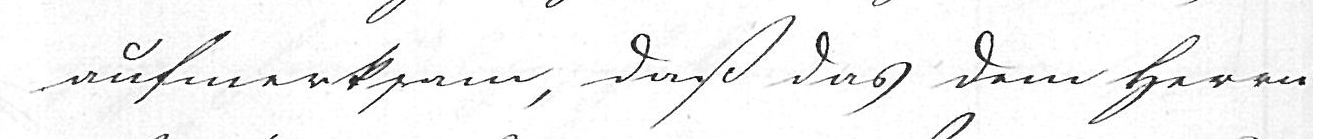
aufmerksam, daß das dem Herrn
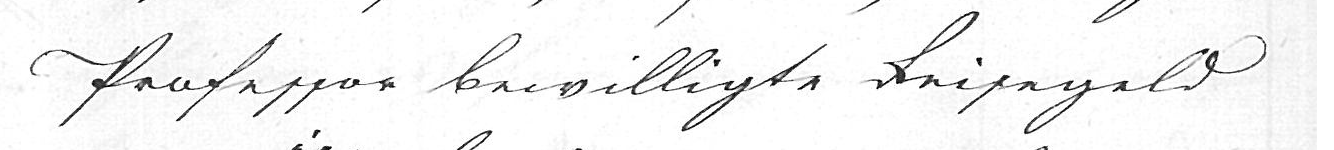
Professor bewilligte Reisegeld
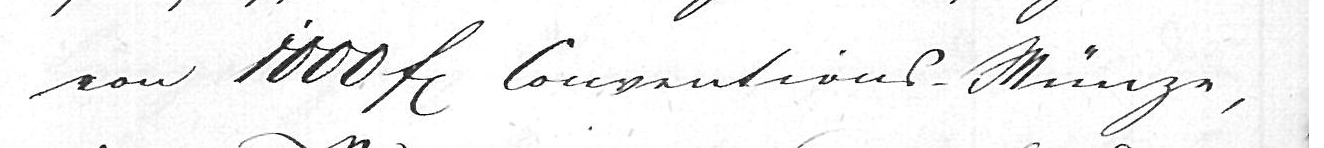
von 1000 fl Conventions-Münze,
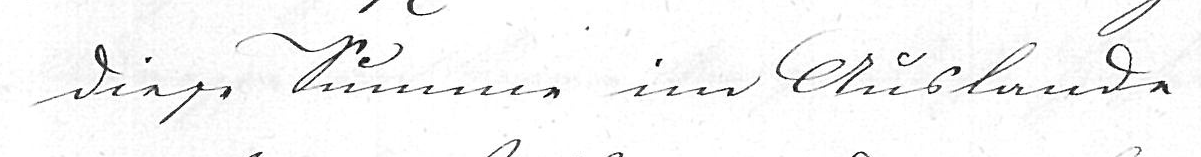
diese Summe im Auslande
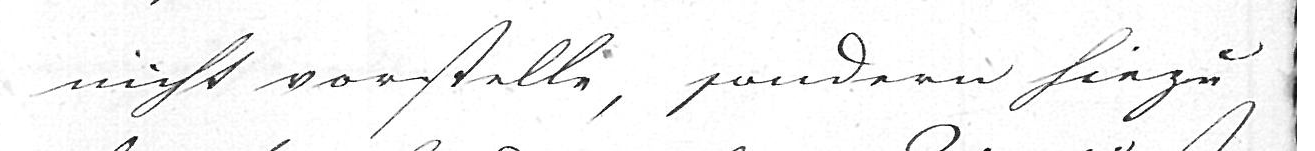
nicht vorstelle, sondern hiezu
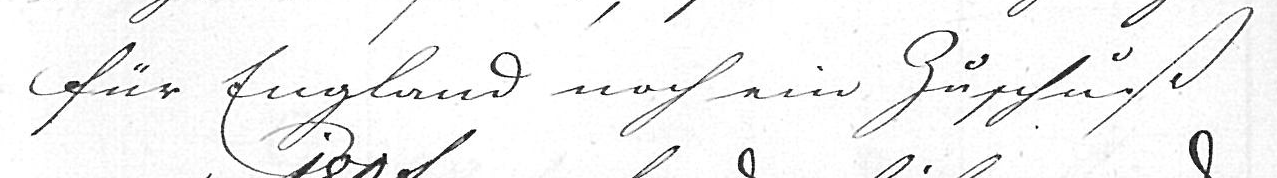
für England noch ein Zuschuß
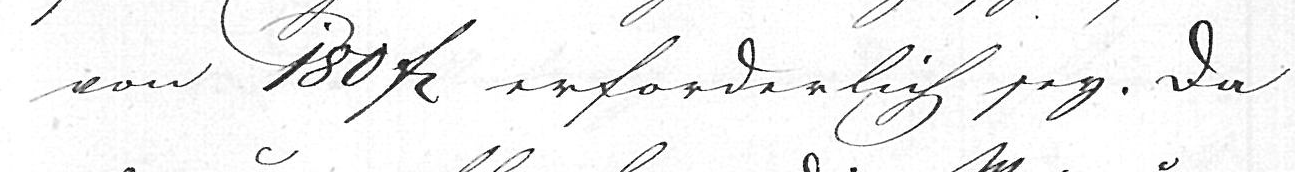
von 180 fr erforderlich sey. Da
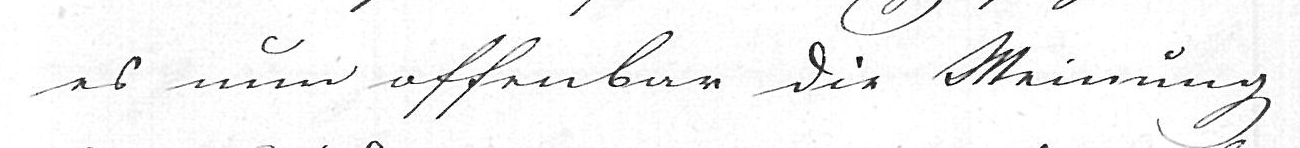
es nun offenbar die Meinung
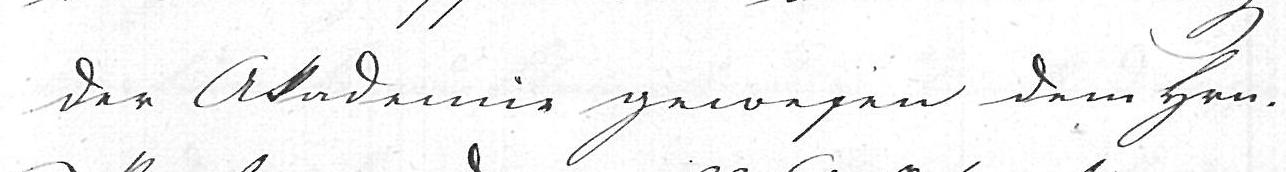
der Akademie gewesen dem Hrn.
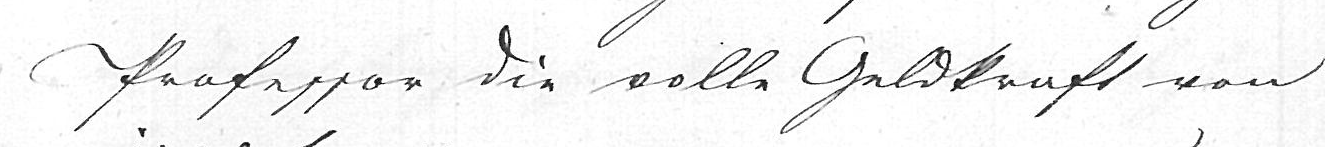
Professor die volle Geldkraft von
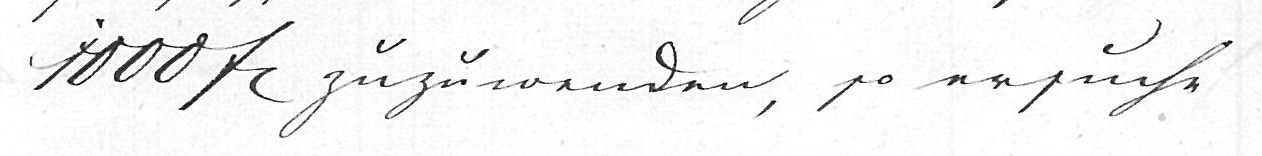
1000 fl zuzuwenden, so ersuche
